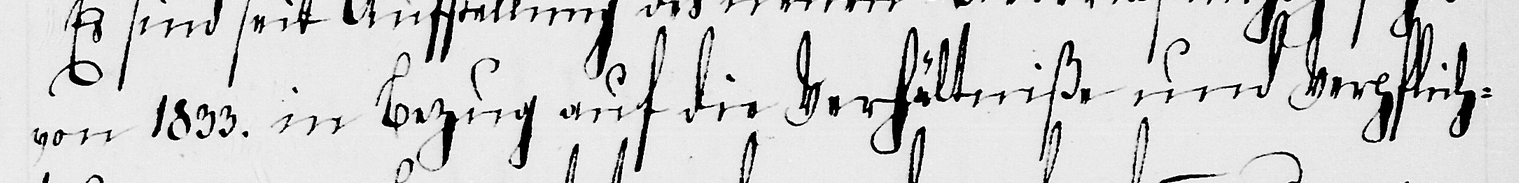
von 1833. in Bezug auf die Verhältnisse und Verpflich¬
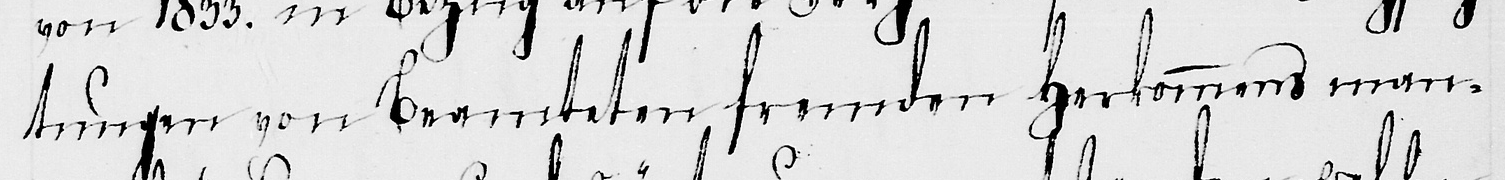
tungen von Beamteten fremden Herkommens man¬
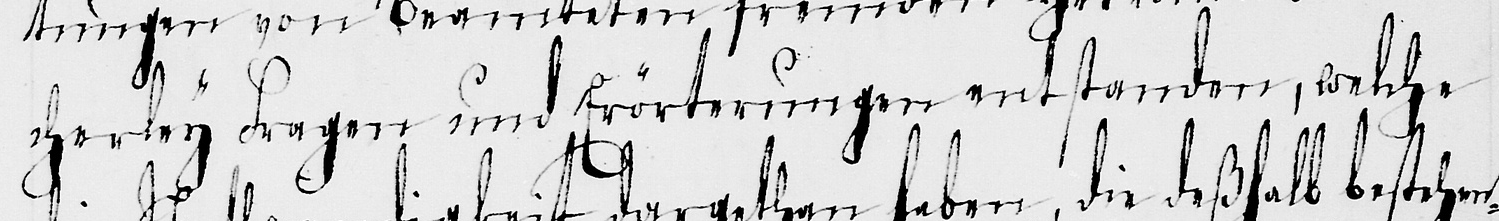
cherley Fragen und Erörterungen entstanden, welche
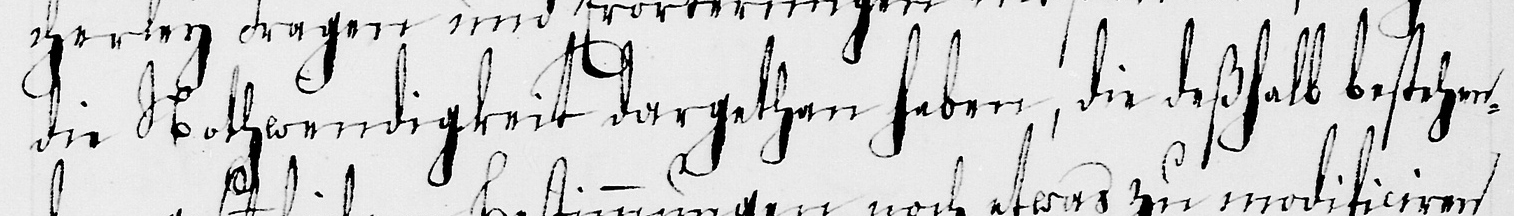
die Nothwendigkeit dargethan haben, die deßhalb besteh¬
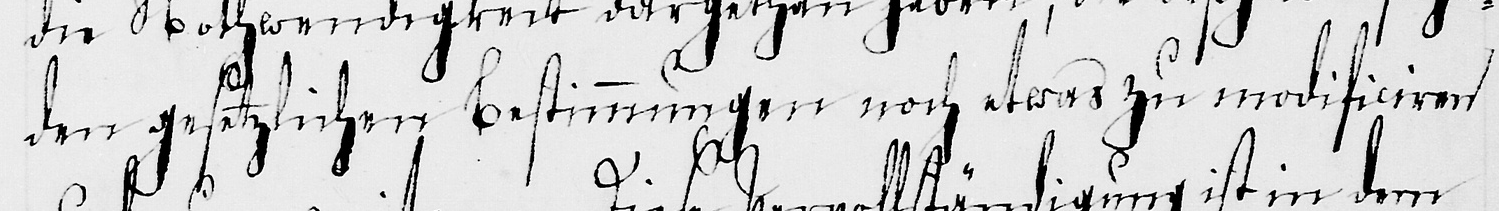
den gesetzlichen Bestimmungen noch etwas zu modificiren
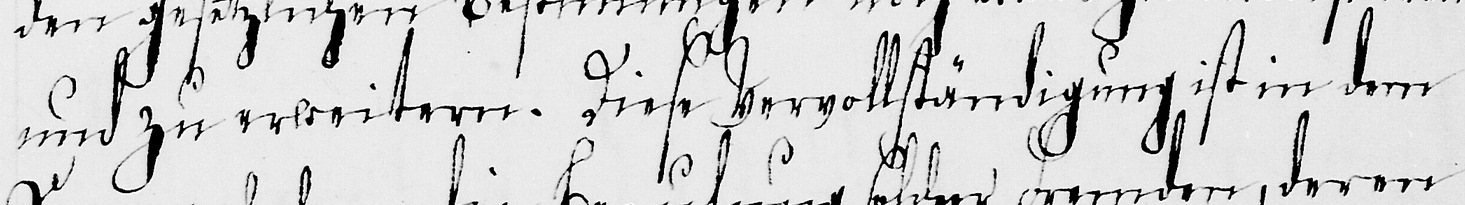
und zu erweitern. Diese Vervollständigung ist in dem
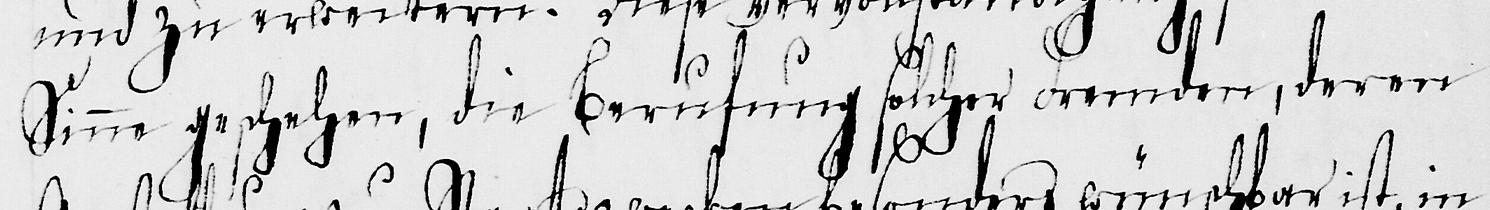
Sinne geschehen, die Berufung solcher Fremden, deren
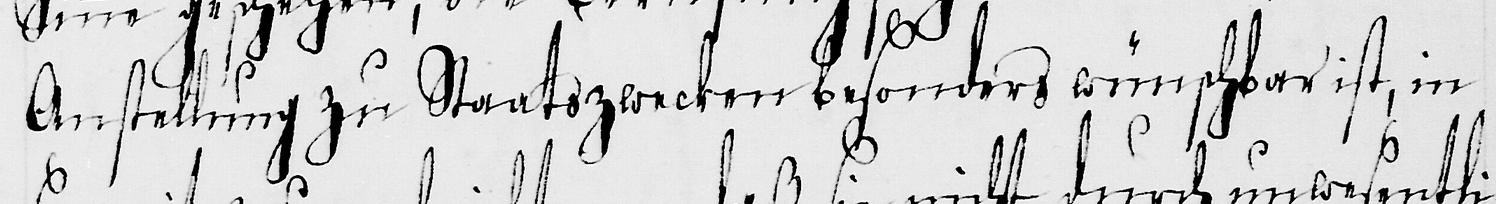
Anstellung zu Staatszwecken besonders wünschbar ist, in
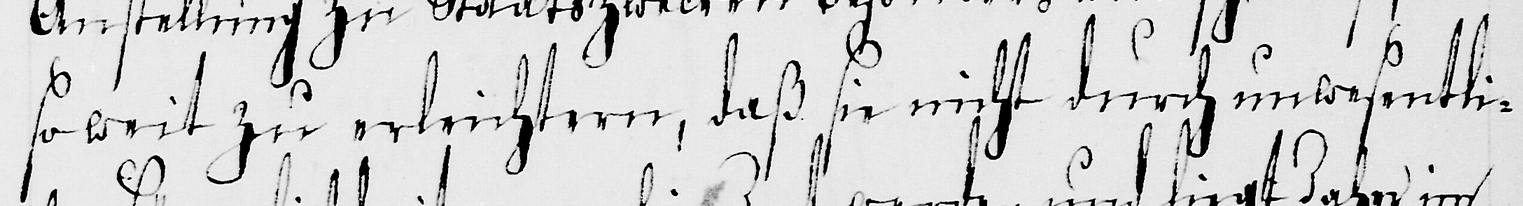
soweit zu erleichtern, daß sie nicht durch unwesentli¬
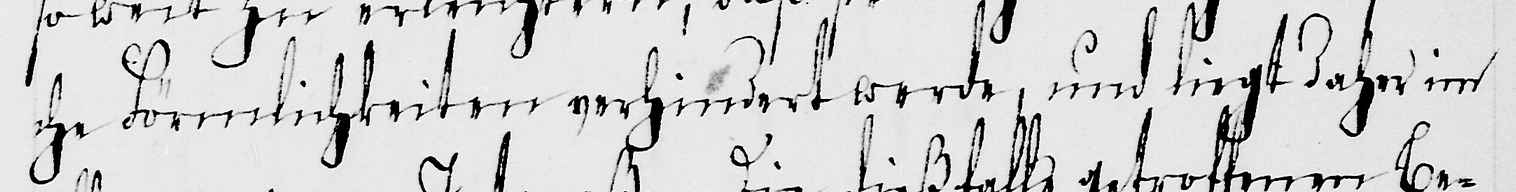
che Förmlichkeiten verhindert werde, und liegt daher im
